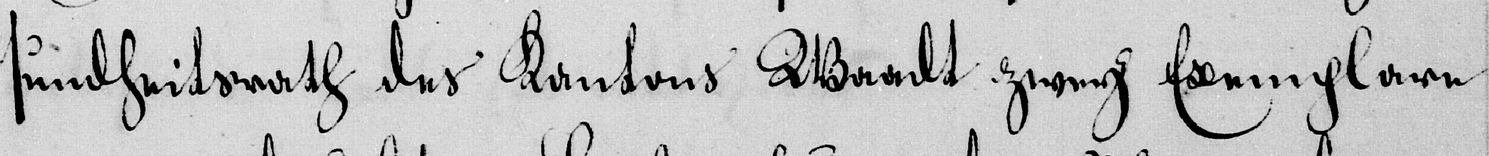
sundheitsrath des Kantons Waadt zwey Exemplare
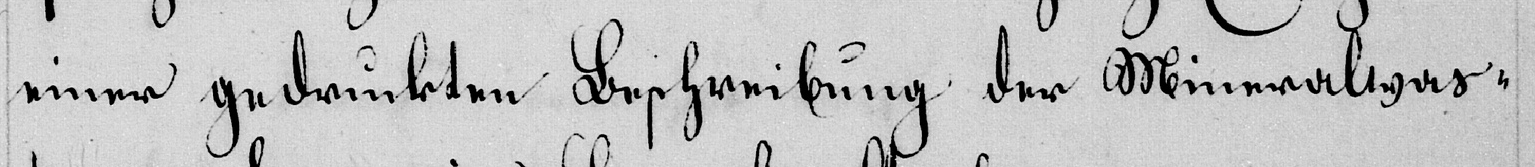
einer gedruckten Beschreibung der Mineralwaß¬
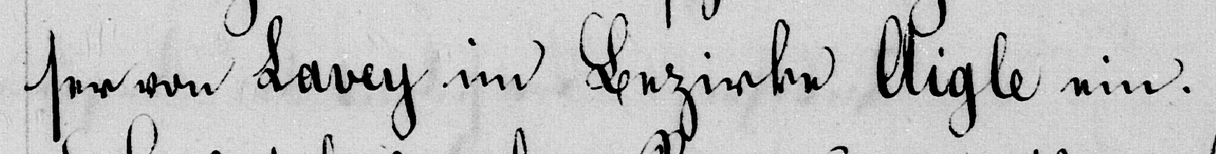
er von Lavey im Bezirke Aigle ein.
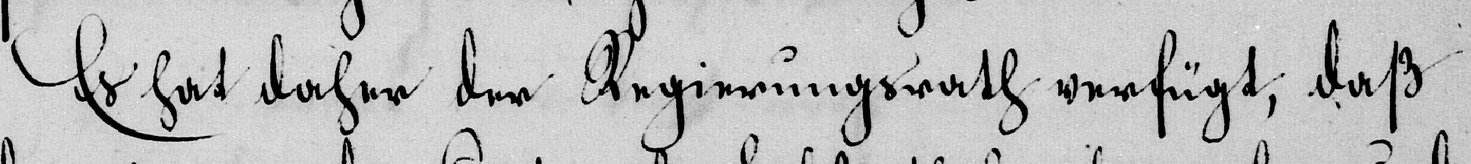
Es hat der Regierungsrath verfügt, daß
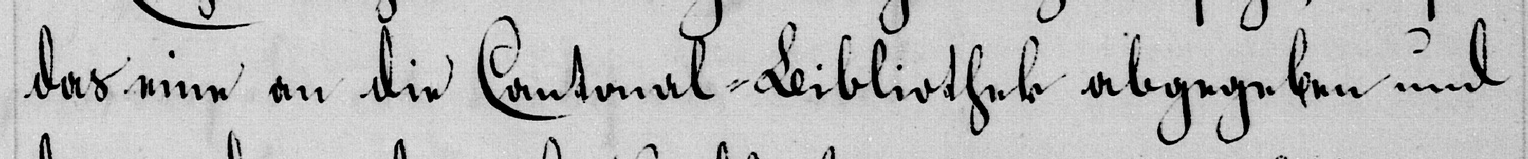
das eine an die Cantonal-Bibliothek abgegeben und
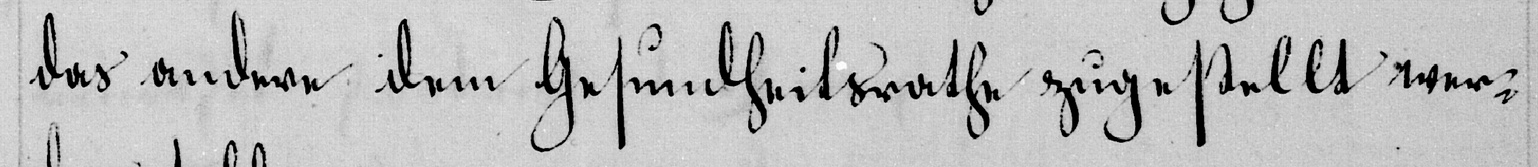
das andere dem Gesundheitsrathe zugestellt wer¬
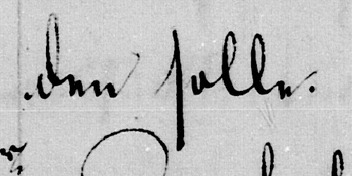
den solle.
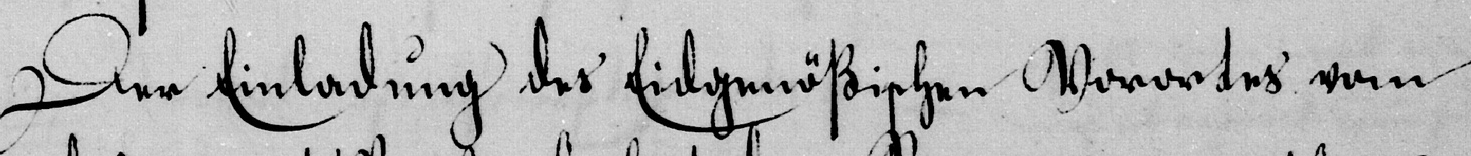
Der Einladung des Eidgenößischen Vorortes vom
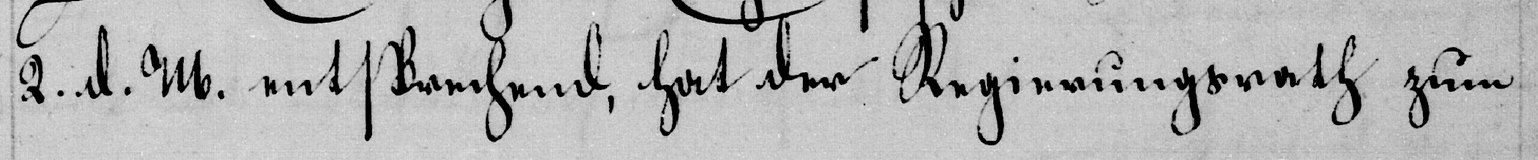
2. d. M. entsprechend, hat der Regierungsrath zum
